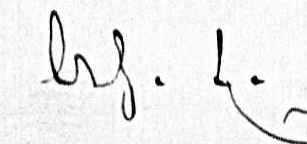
Ah. E.
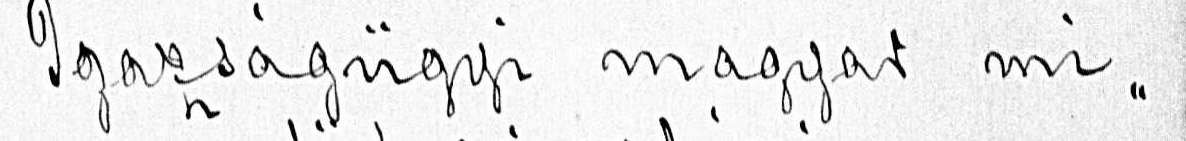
Igazságügyi Magyar mi¬
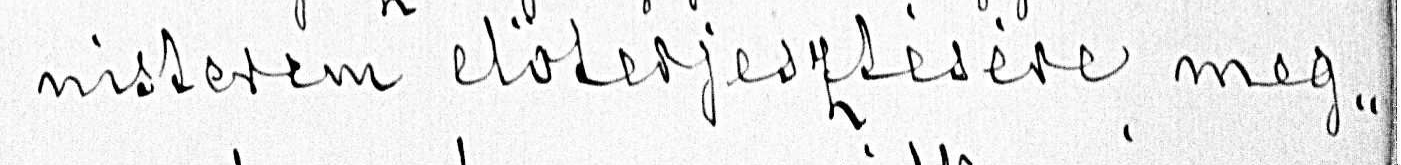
nisterem elöterjesztésére meg¬
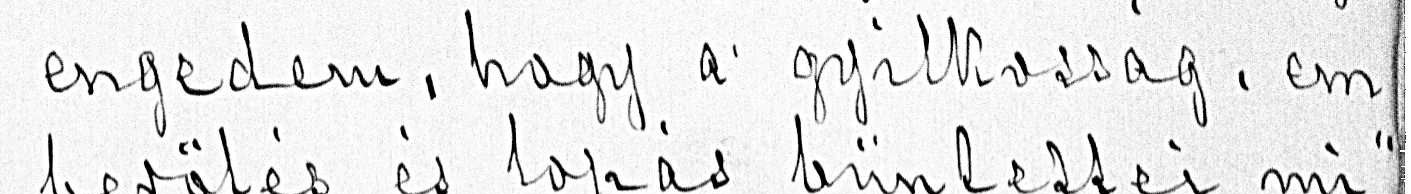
engedem, hogy a gyilkosság em¬
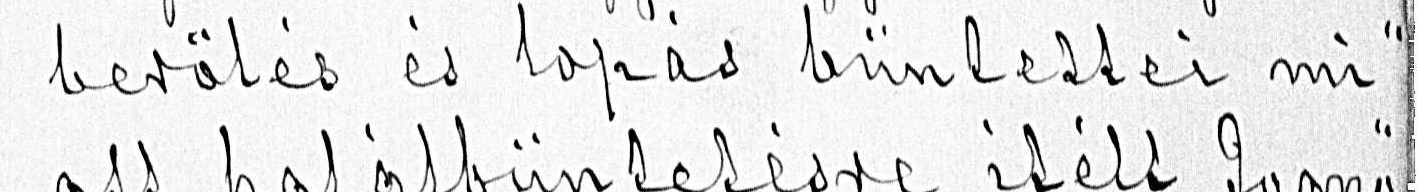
berölés és lopás büntettei mi¬
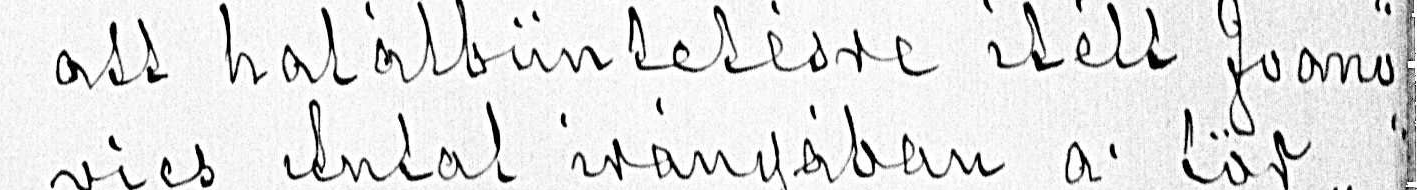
att halálbüntetésre itélt Joano¬
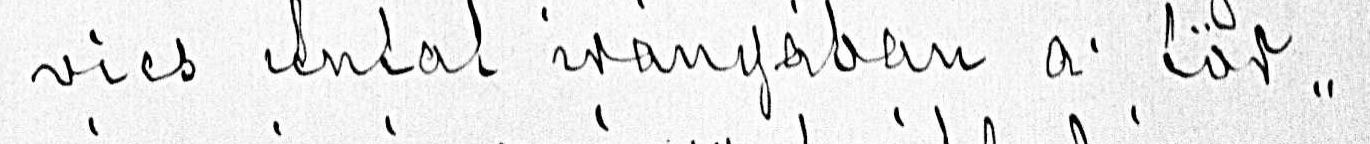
vics Antal irángában a tör¬
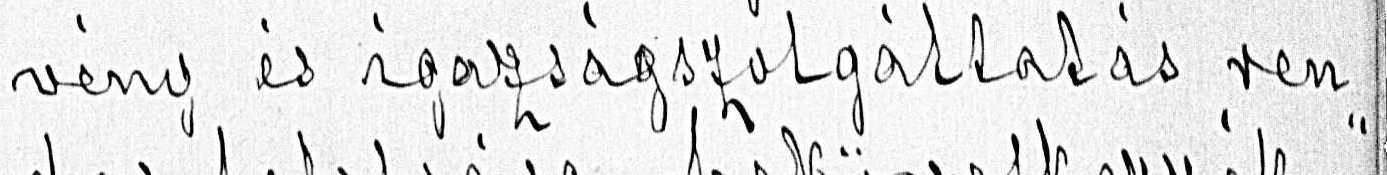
veny es igazságszolgáltatás ren¬
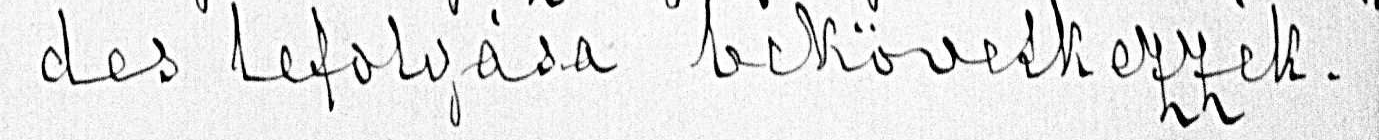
des lefolgása bekövektezzék.
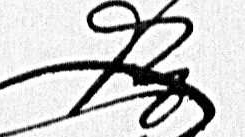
FJ
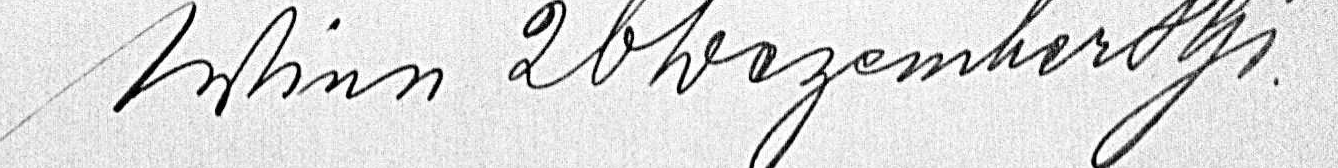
Wien 26 Dezember 891
